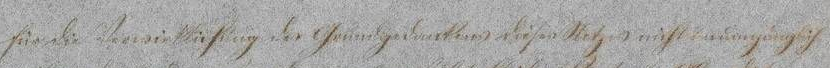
für die Verwirklichung des Grundgedankens dieses Netzes nicht unumgänglich
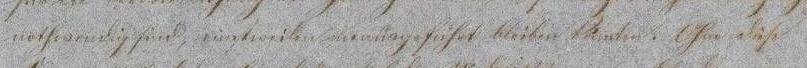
nothwendig sind, einstweilen unausgeführt bleiben könnten. Ohne diese
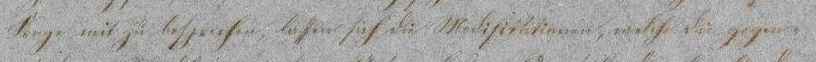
Frage mit zu besprechen, lassen sich die Modifikationen, welche die gegen-
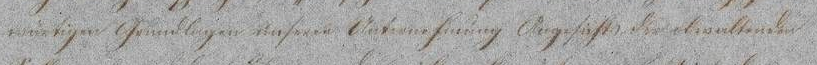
wärtigen Grundlagen unserer Unternehmung Angesichts der obwaltenden
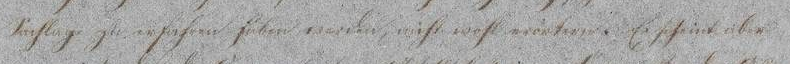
Sachlage zu erfahren haben werden, nicht wohl erörtern. Es scheint aber
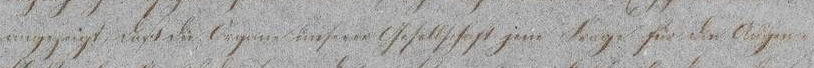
angezeigt, daß die Organe unserer Gesellschaft jene Frage für den Augen-
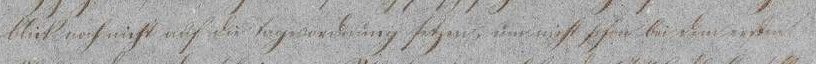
blick noch nicht auf die Tagesordnung setzen, um nicht schon bei dem ersten
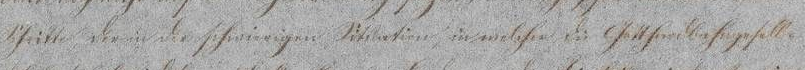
Schritte, der in der schwierigen Situation, in welcher die Gotthardbahngesell-
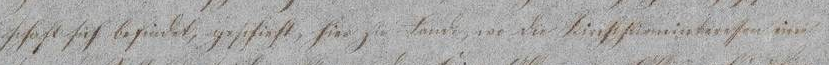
schaft sich befindet, geschieht, hier zu Lande, wo die Kirchthurminteressen eine
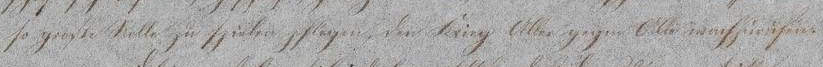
so große Rolle zu spielen pflegen, den Krieg Aller gegen Alle wachzurufen.
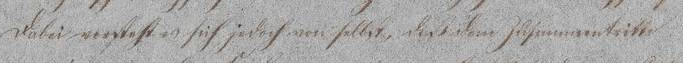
Dabei versteht es sich jedoch von selbst, daß dem Zusammentritte
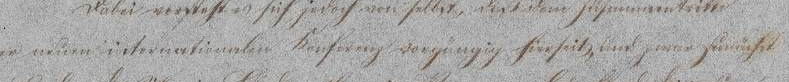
einer neuen internationalen Konferenz vorgängig hierseits, und zwar zunächst
